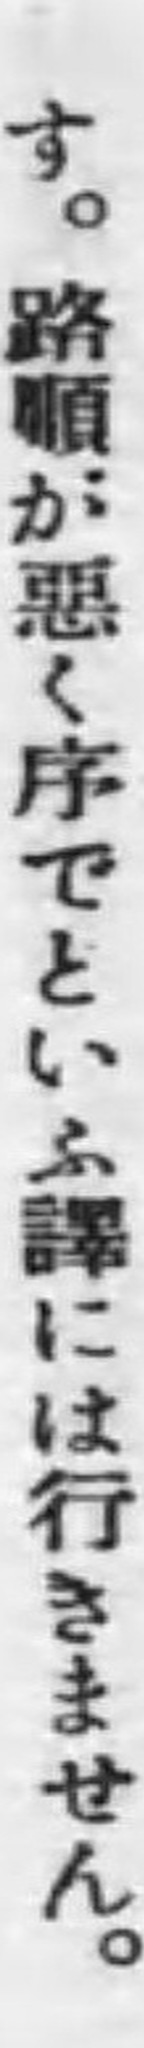す。路順が悪く序でといふ訳には行きません。
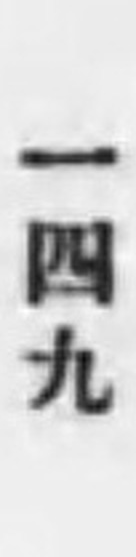一四九

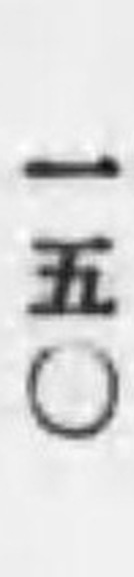一五〇
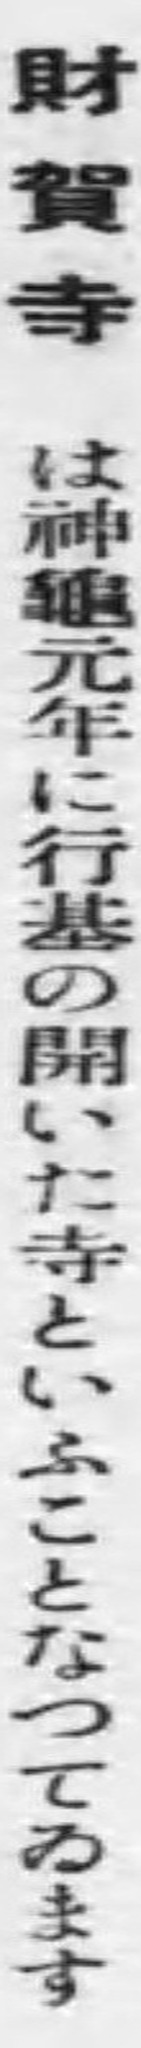財賀寺は神亀元年に行基の開いた寺といふことなつてゐます
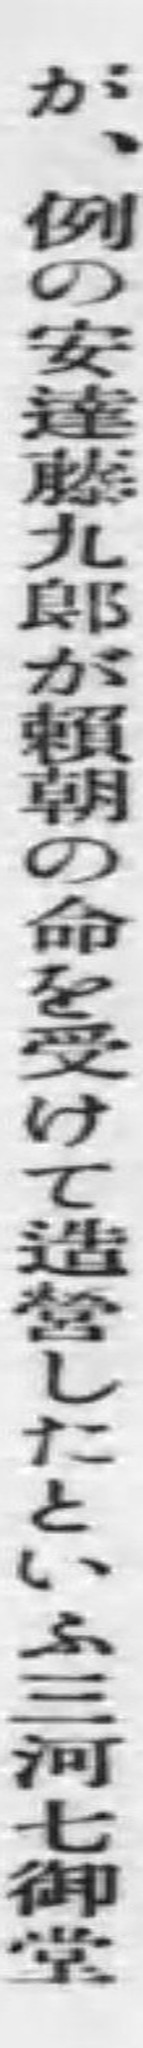が、例の安達藤九郎が頼朝の命を受けて造営したといふ三河七御堂
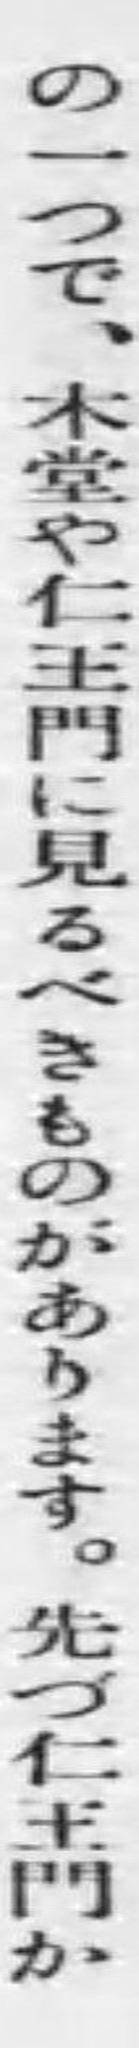の一つで、木堂や仁王門に見るべきものがあります。先づ仁王門か
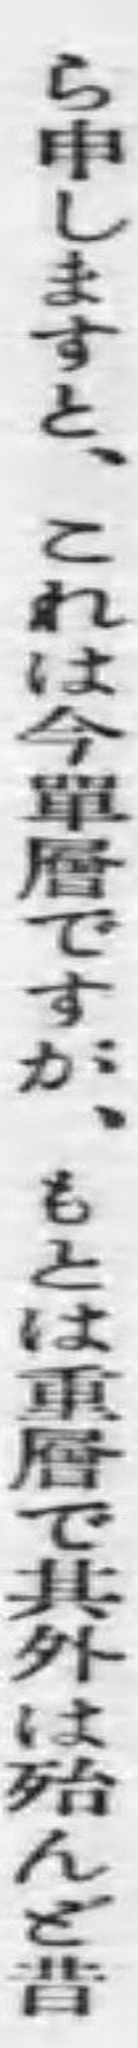ら申しますと、これは今単層ですが、もとは重層で其外は殆んど昔
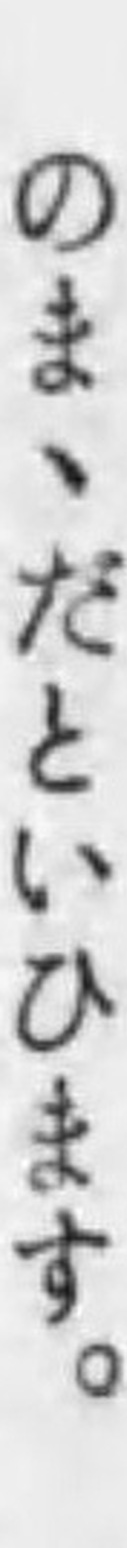のまゝだといひます。
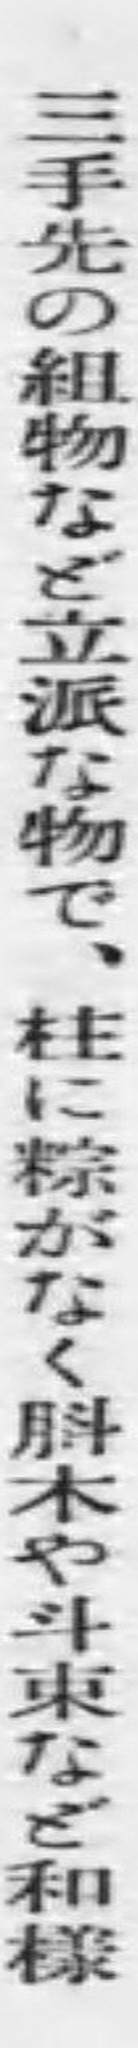三手先の組物など立派な物で、柱に粽がなく肘木や斗束など和様
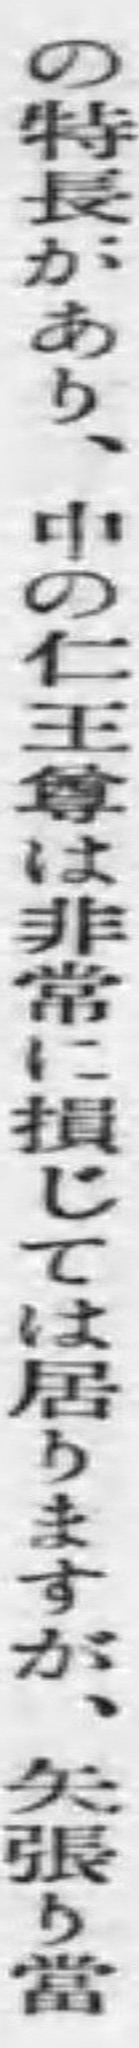の特長があり、中の仁王尊は非常に損じては居りますが、矢張り当
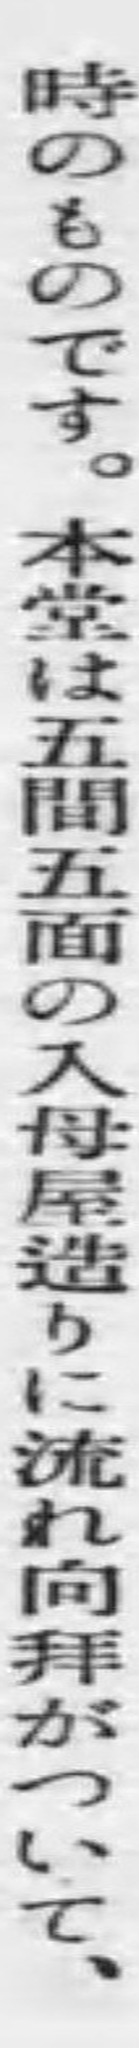時のものです。本堂は五間五面の入母屋造りに流れ向拝がついて、
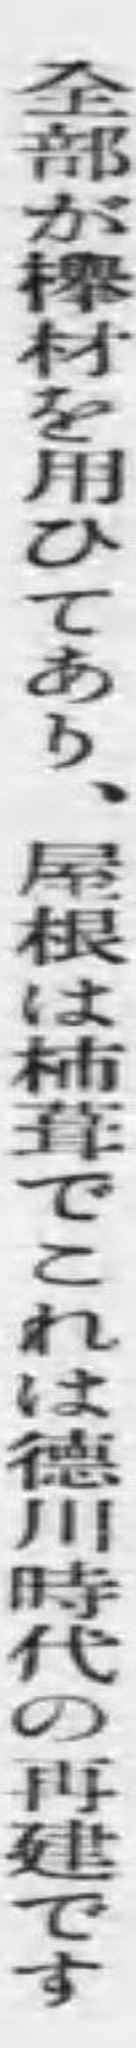全部が欅材を用ひてあり、屋根は杮葺でこれは徳川時代の再建です
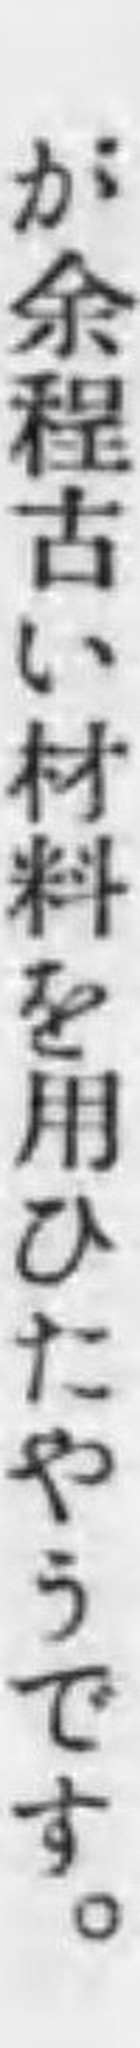が余程古い材料を用ひたやうです。
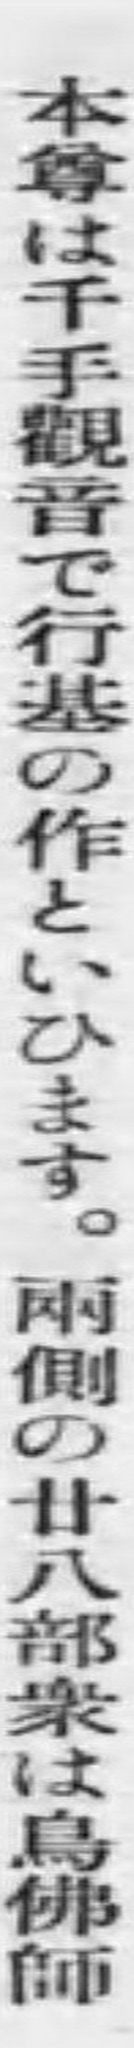本尊は千手観音で行基の作といひます。両側の廿八部衆は鳥仏師
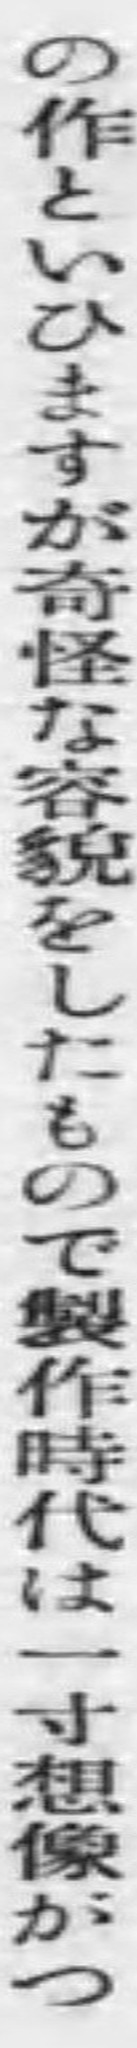の作といひますが奇怪な容貌をしたもので製作時代は一寸想像がつ
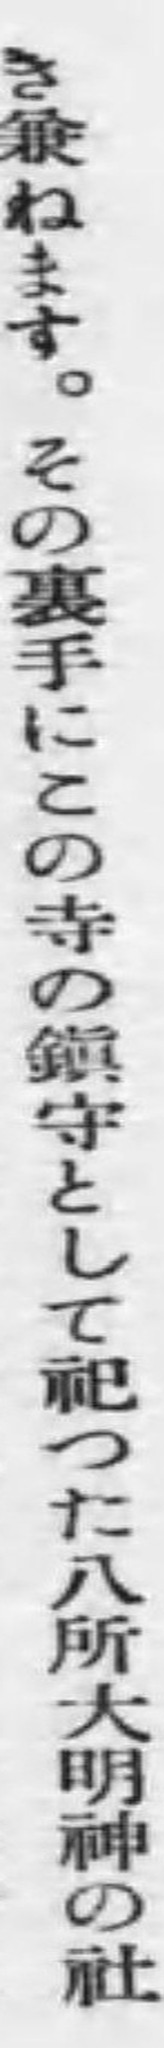き兼ねます。その裏手にこの寺の鎮守として祀つた八所大明神の社
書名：東三河道中記 : 豊橋市及其附近案内
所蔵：国立国会図書館 National Diet Library, JAPAN
